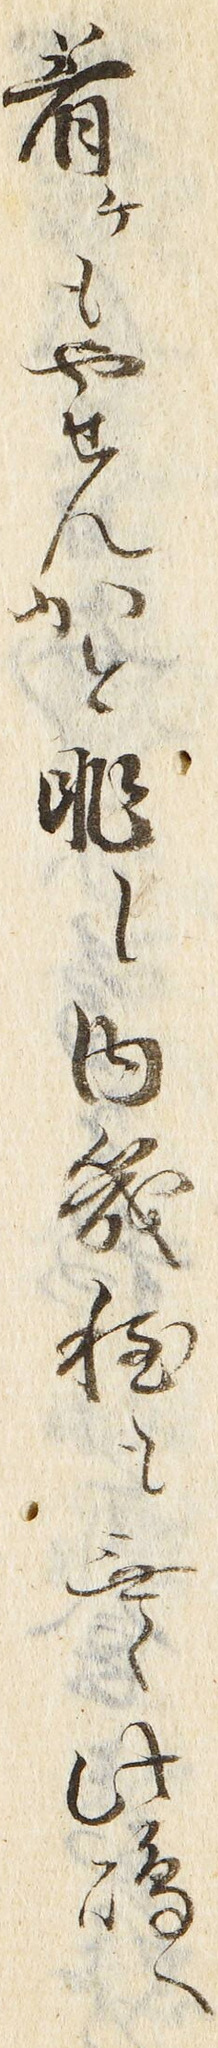着ヶもやせんかと眺し内幾程も無之此島へ
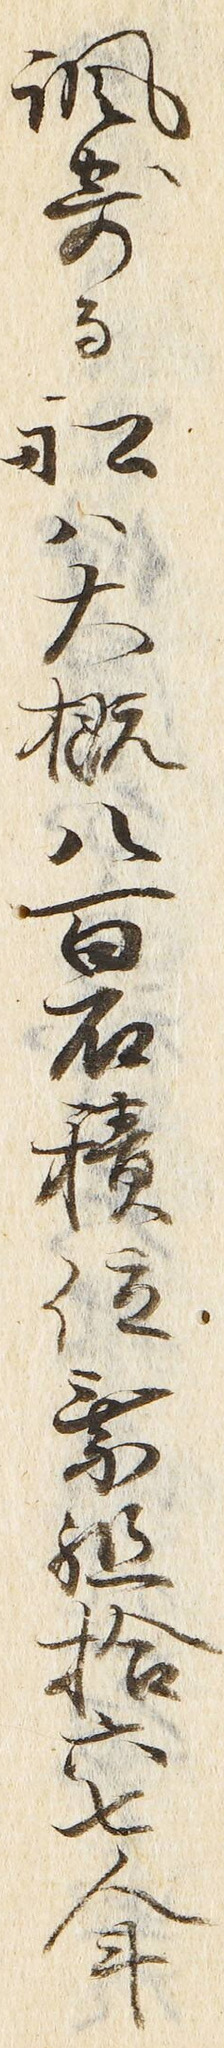諷寄る船は大概八百石積位乗組重拾六七人計
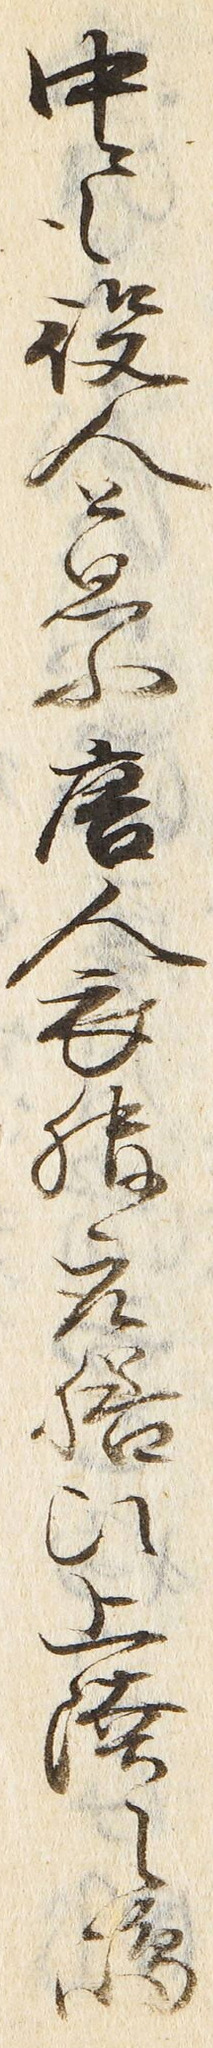中役人と思ふ唐人衣服取繕ひ上陸し島
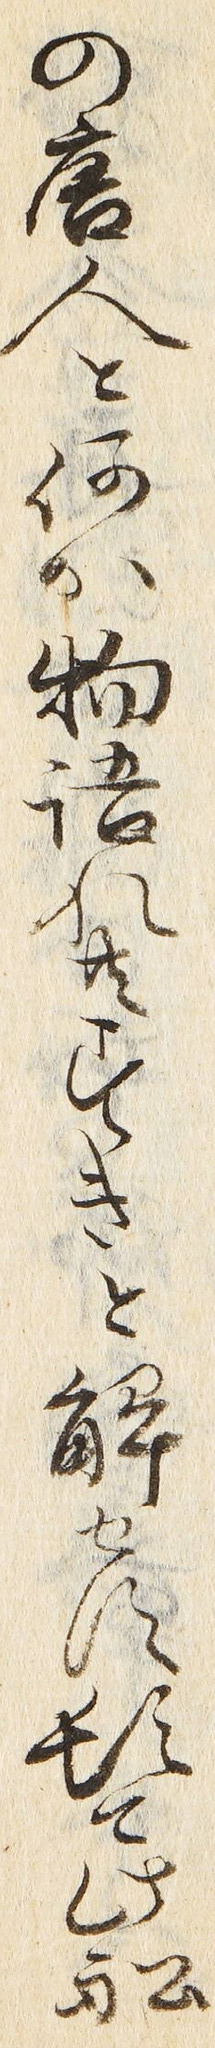の唐人と何か物語れ共すきと解せすて此船
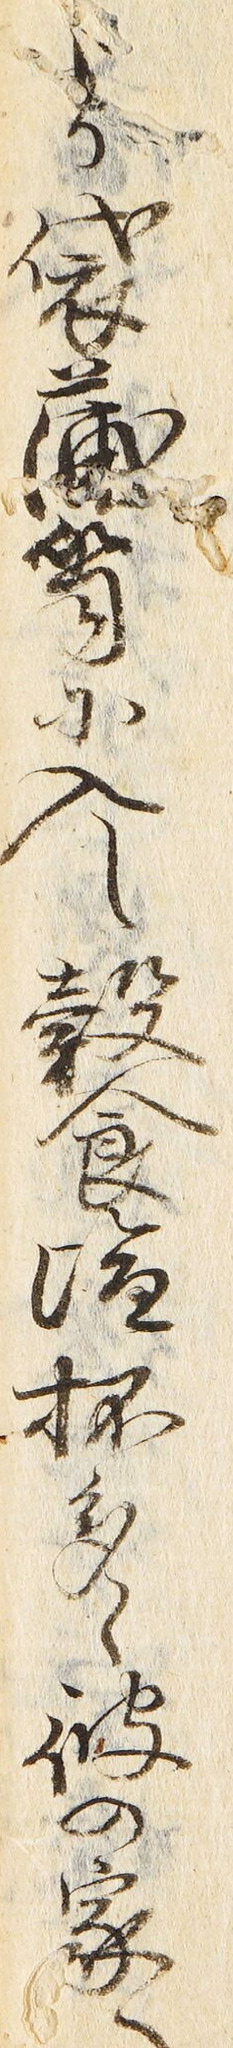より袋蒲笥に入し穀食塩抔多く彼の家へ
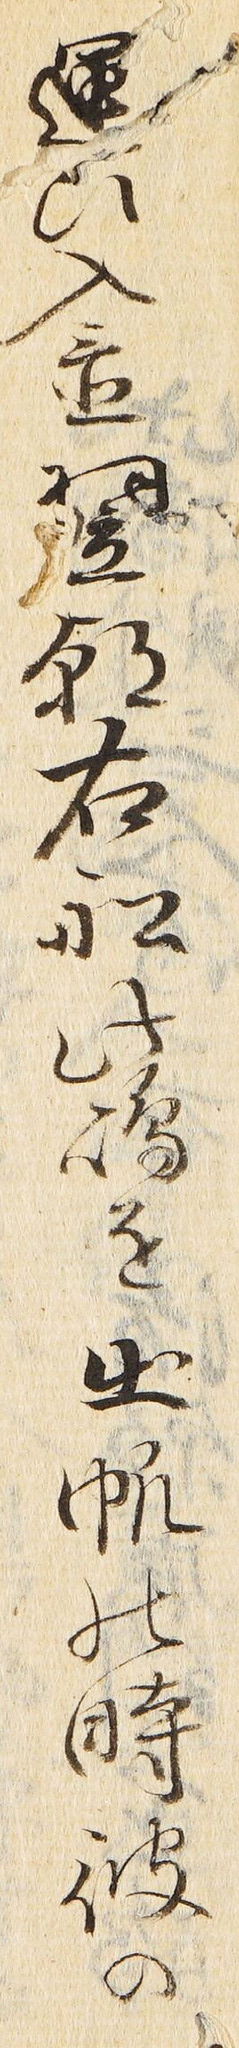運ひ入置翌朝右船此島を出帆の時彼の
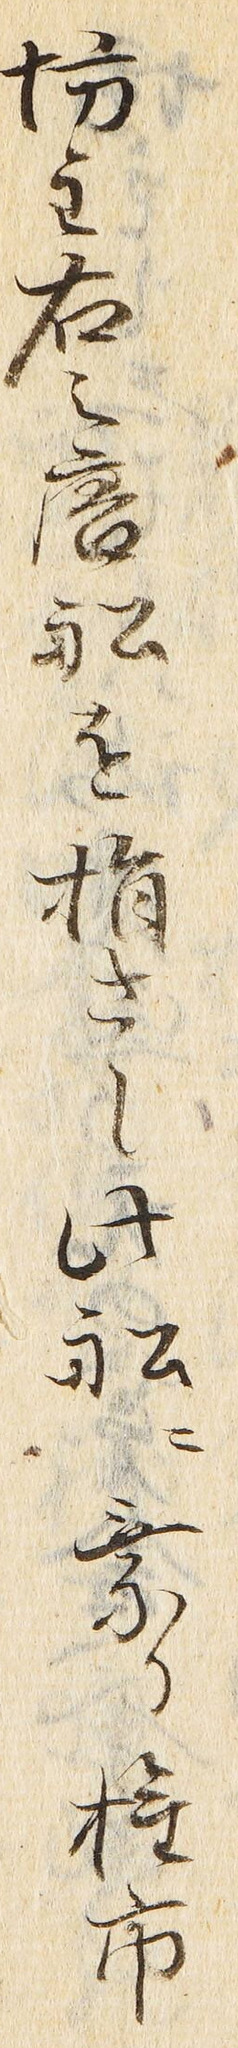坊主右之唐船を指さし此船乗り権市
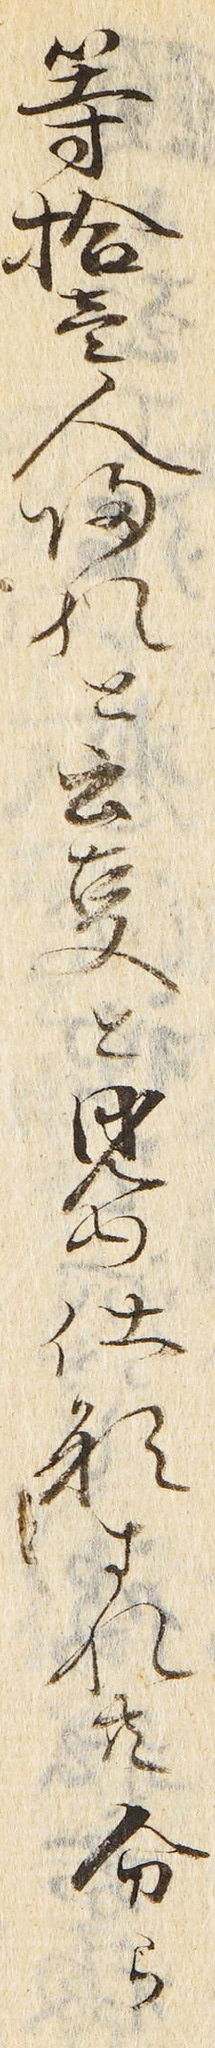等拾壱人帰れと云事と見ゆ仕形すれ共分ら
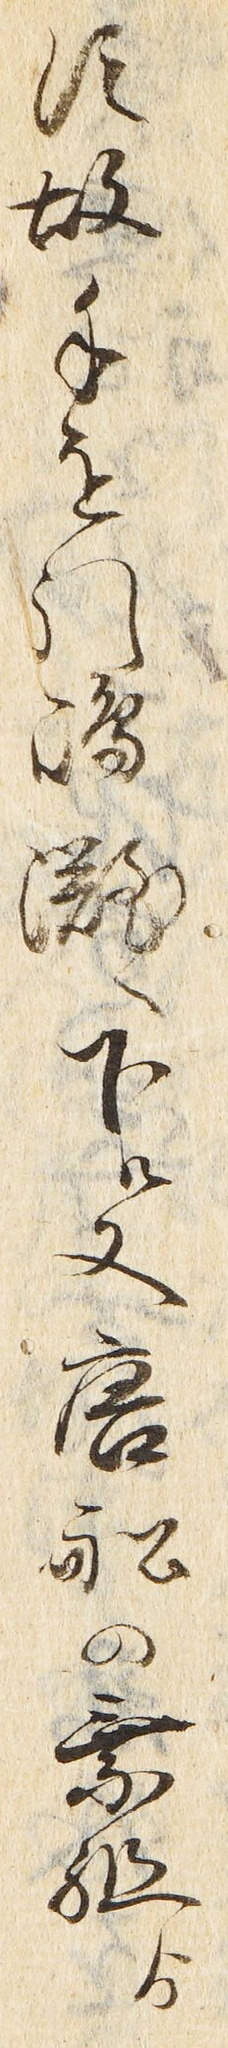す故手を引し島灘へ下ㇽ又唐船の乗組ゟ
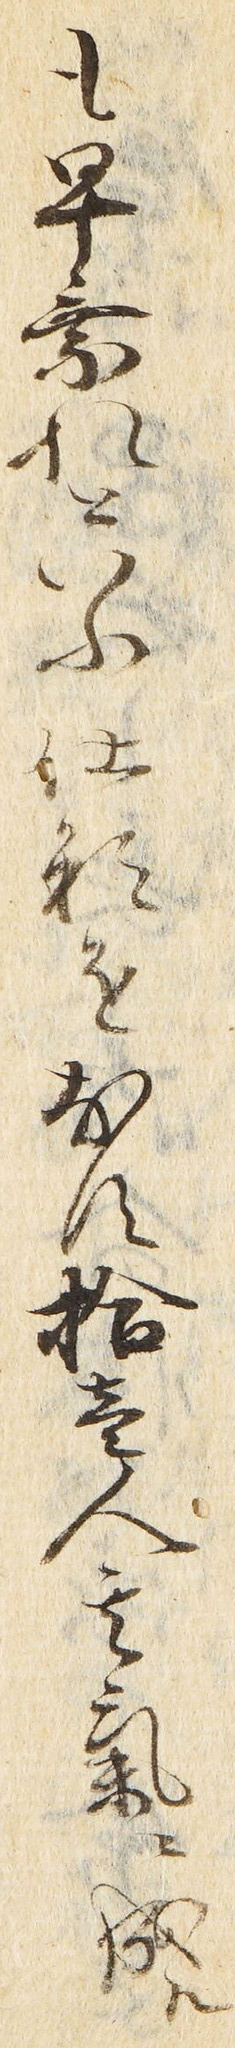も早乗れといふ仕形をなす拾壱人其気成ㇽ
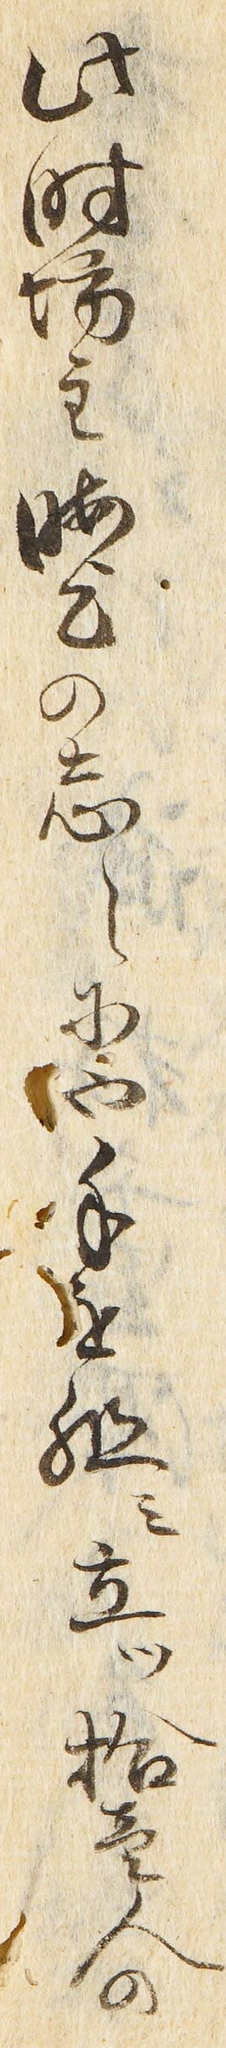此時坊主暇乞の志しにや手を組立拾壱人の

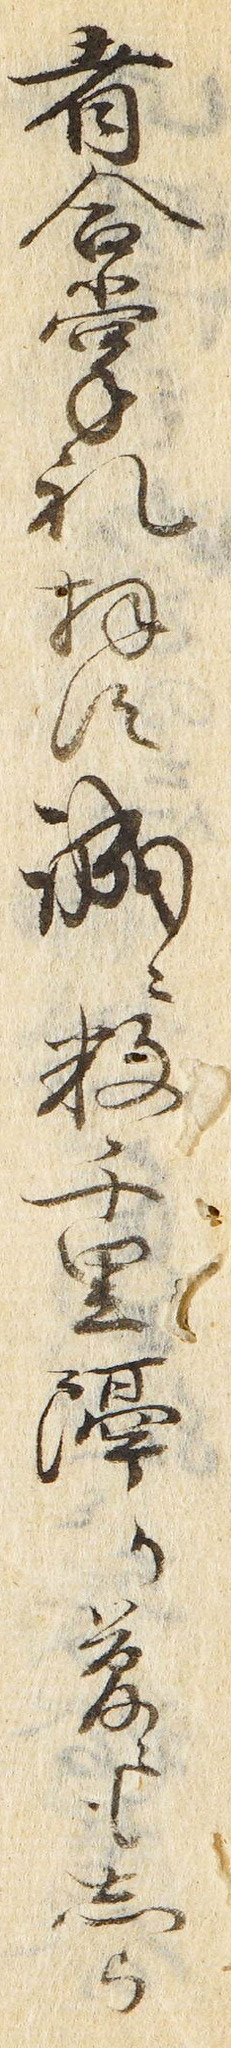者合掌礼拝す誠数千里隔り夢
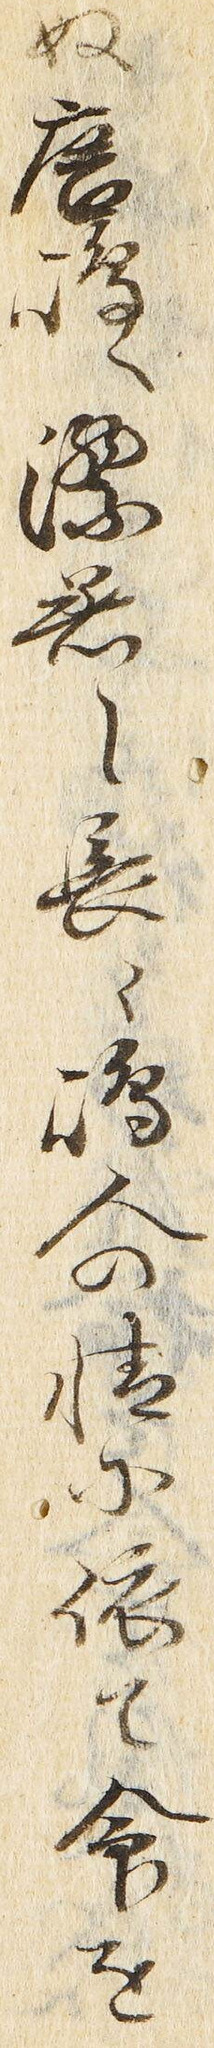ぬ唐島へ漂着し長く島人の情に依て命を
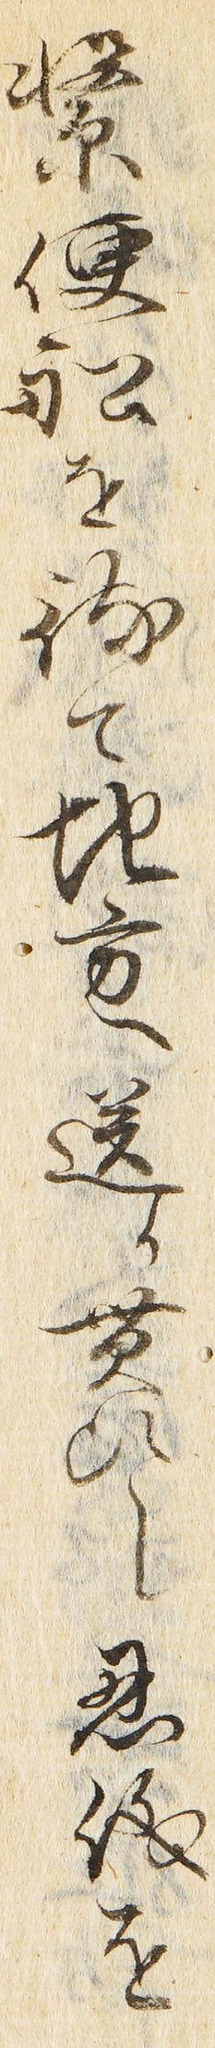繋便船を待て地方へ送り貰ひし恩儀を
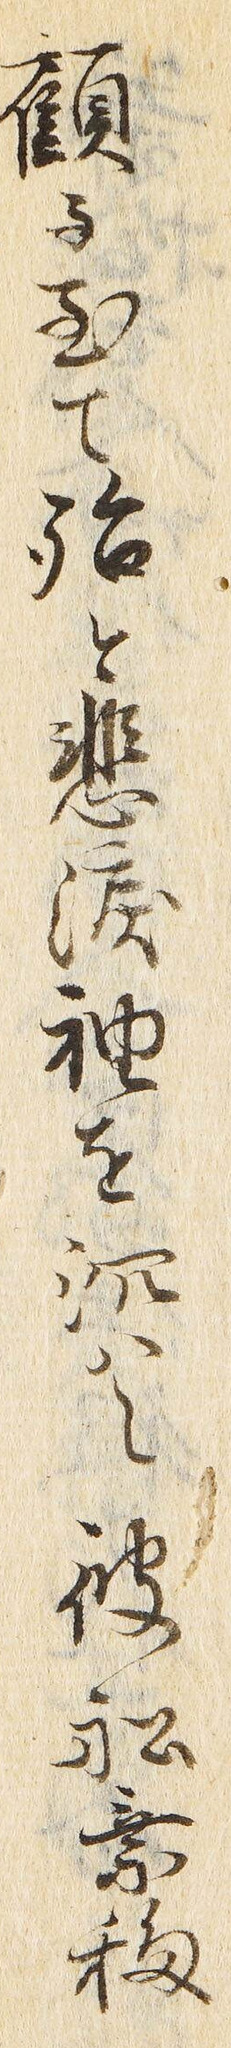顧而至て殆と悲涙袖を沉はし彼船乗移
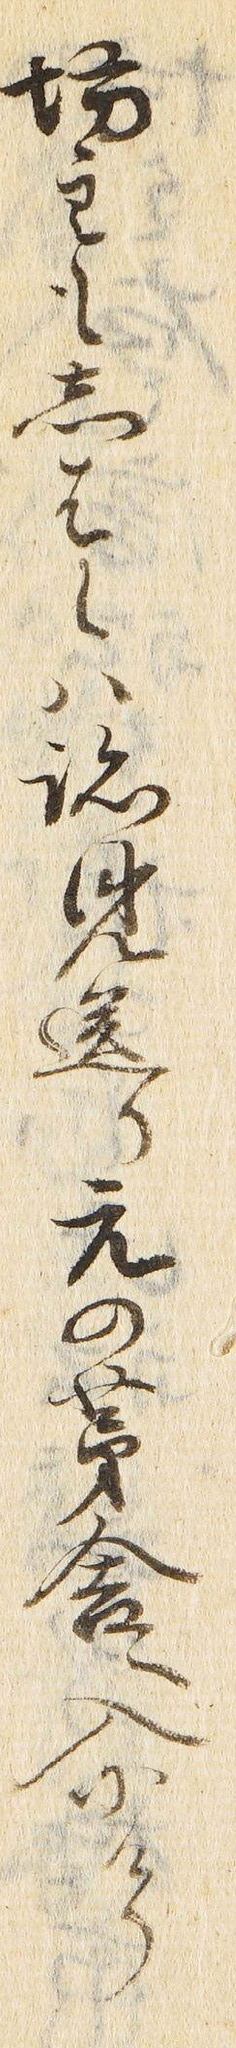坊主もしはし跡見送り元の茅舎へ入にけり
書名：唐物語
